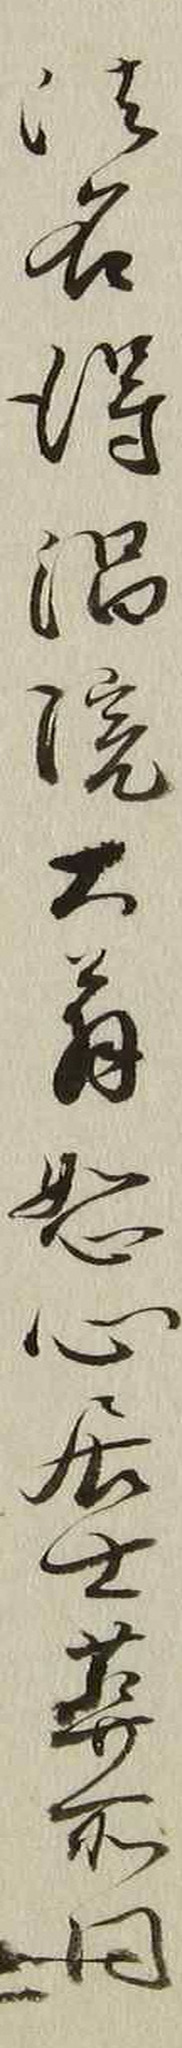法名得温院大扇悲心居士葬所同上
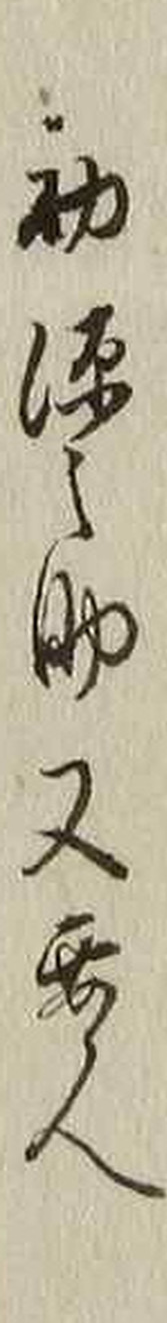初源之助又要人
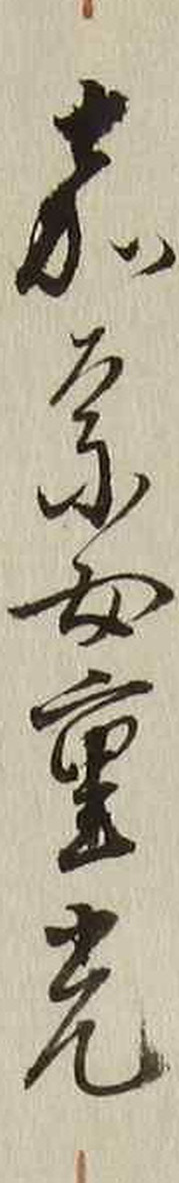嘉奈女重光
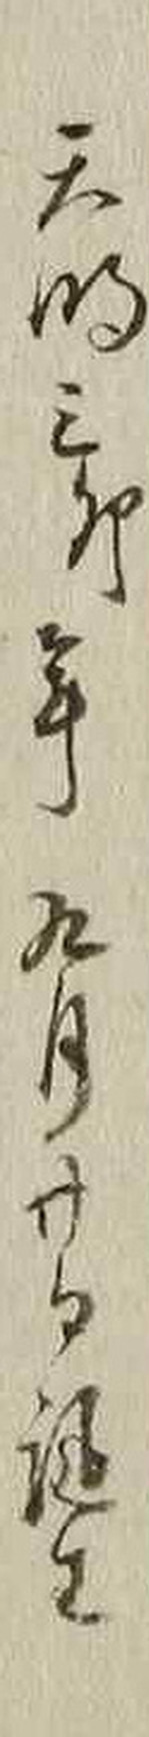天明三卯年九月廿日誕生
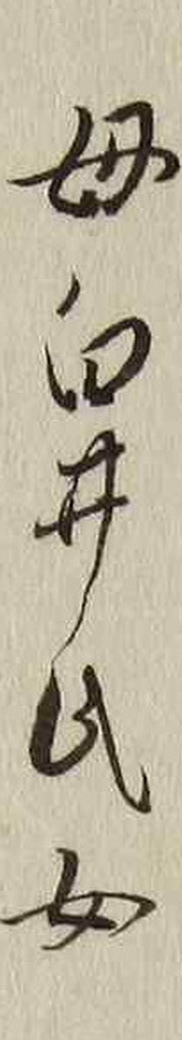母白井氏女
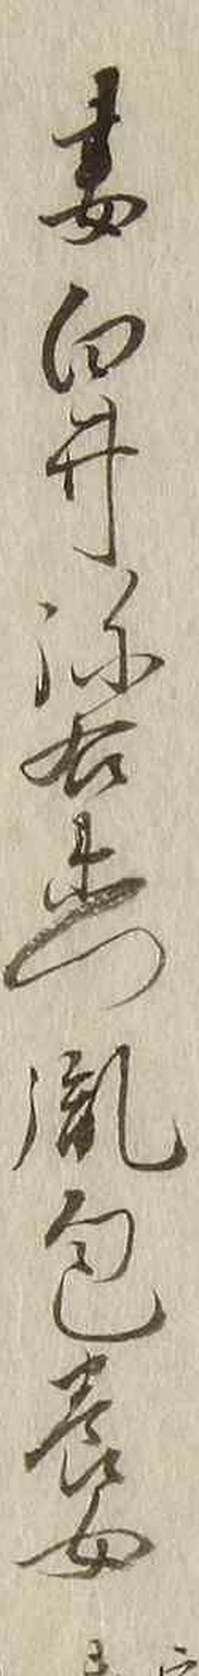妻白井弥右衛門胤包養女
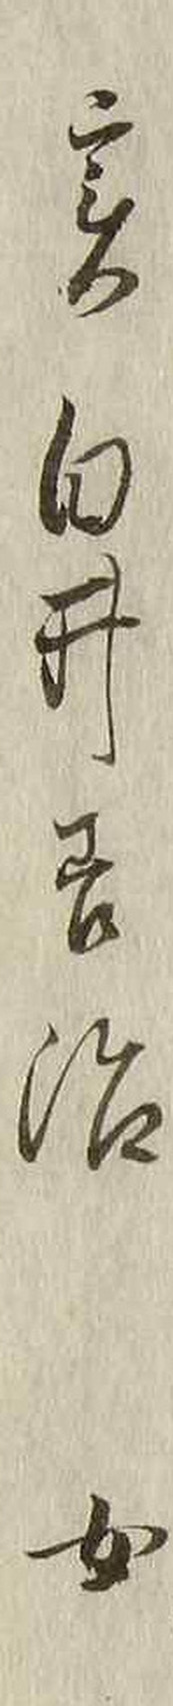実白井善治女
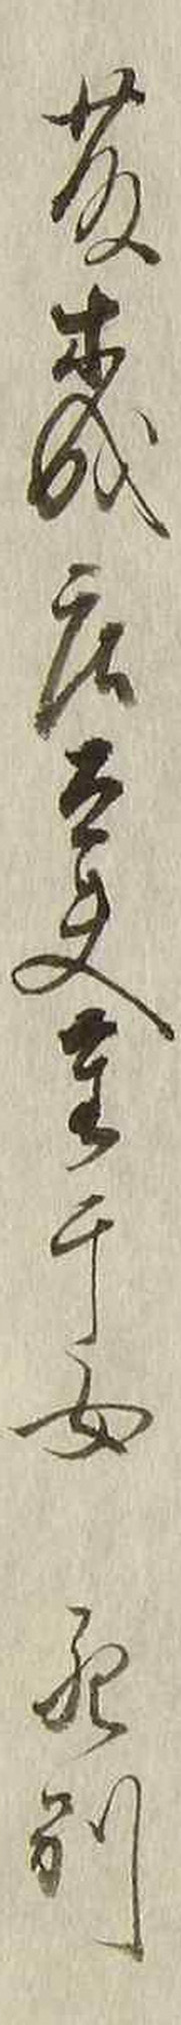藤森庄太夫重干女死別

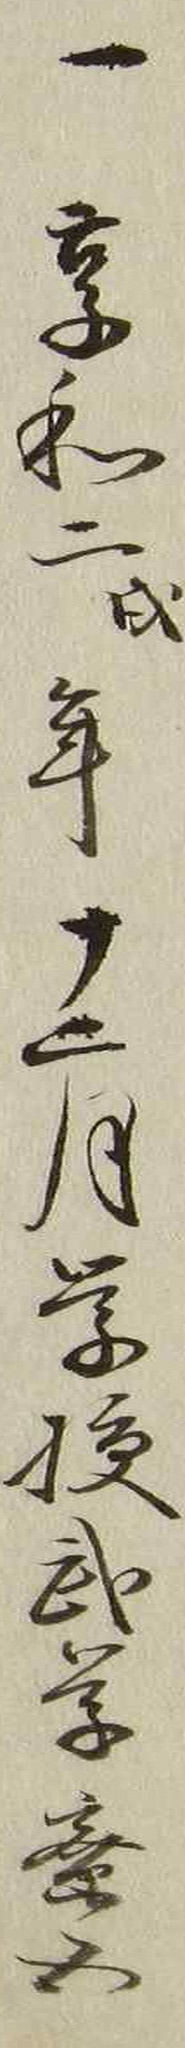一享和二戌年十二月学校武学寮五
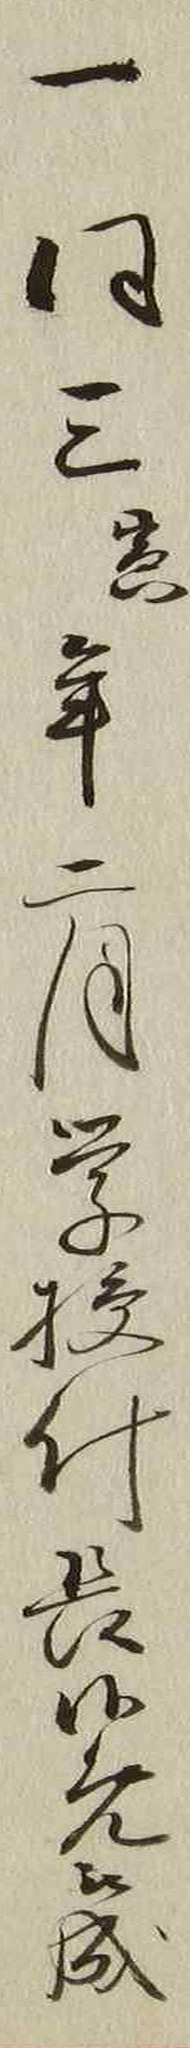一同三寅年二月学校什長御免成られ
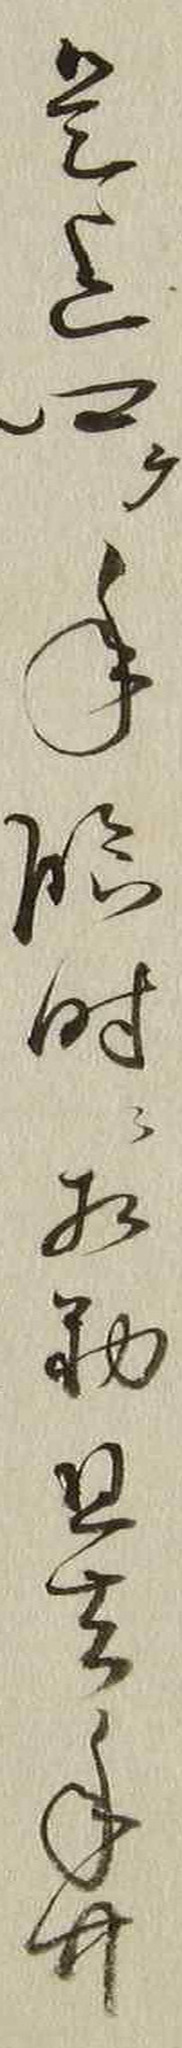是迄四ケ年臨時ニ相勤め且去年中
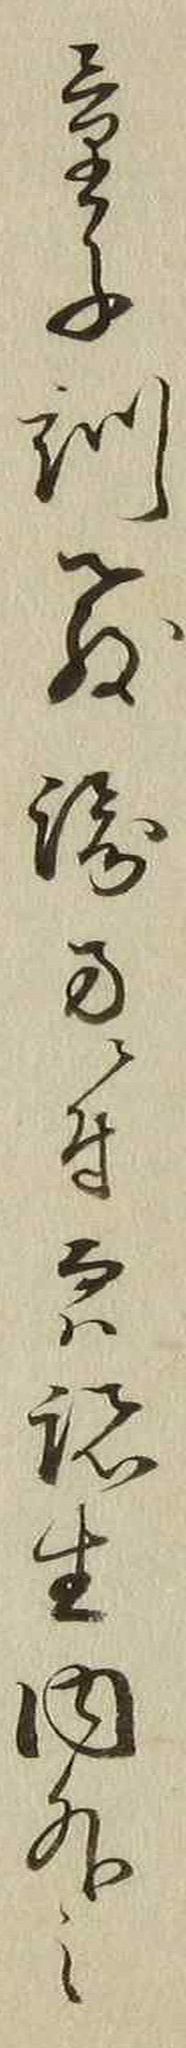童子訓教諭方ニ付てㇵ諸生内外之
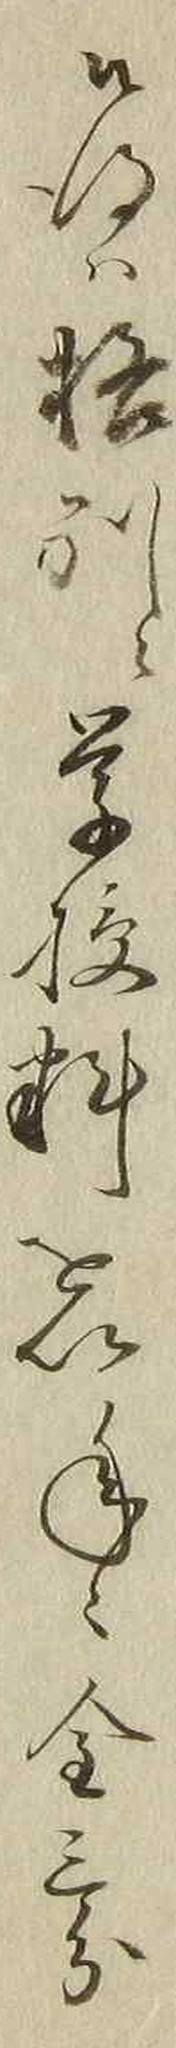候得バ格別ニ学校料を以て年々金三分
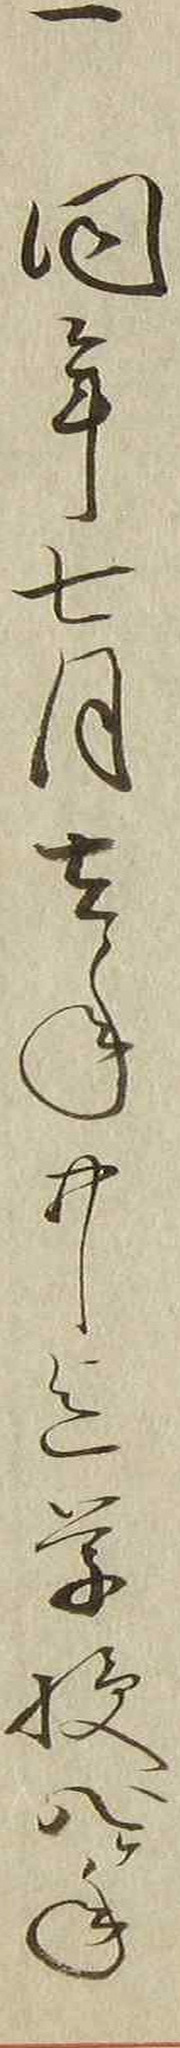一同年七月去年中迄学校へ八ケ年

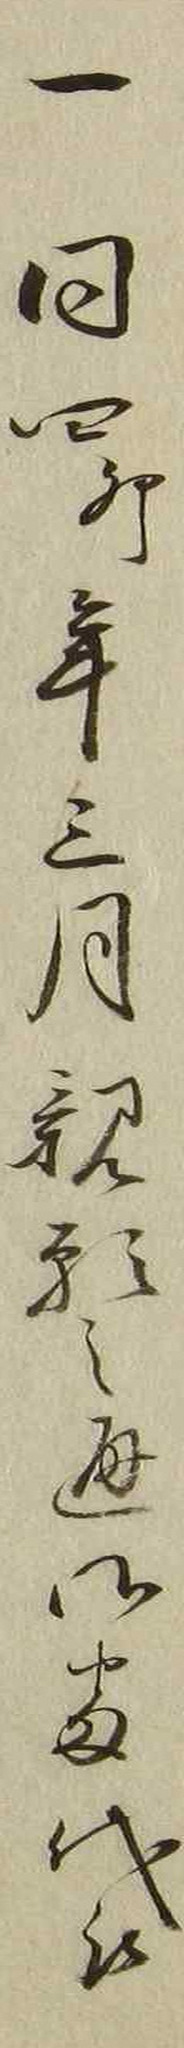一同四卯年三月親願い之通り御番代
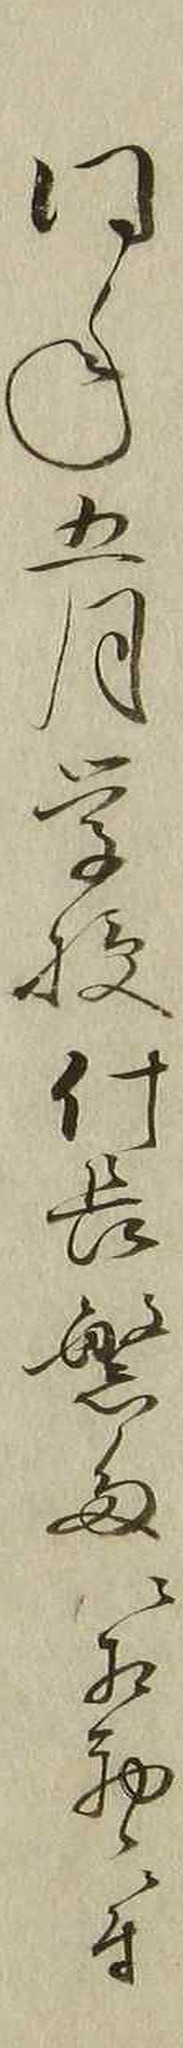一同年五月学校什長繁多ニ相勤め候ニ付き
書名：諸士系譜　巻之20　い之部20
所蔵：会津若松市立会津図書館
